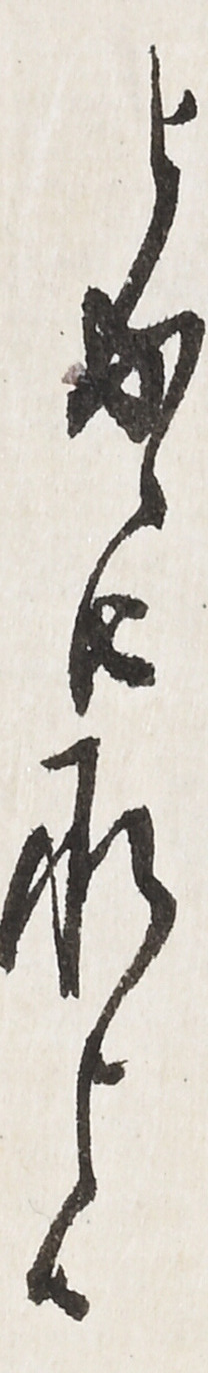被成候由承申候
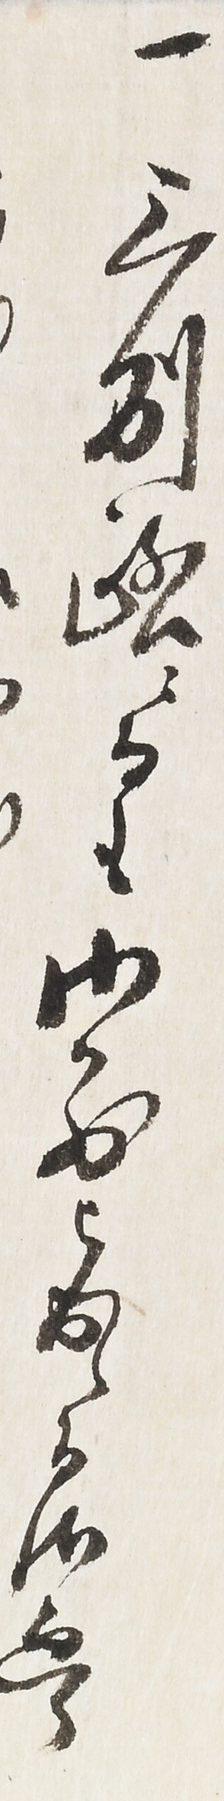一三州路ニ而も御別被成候而御廻り
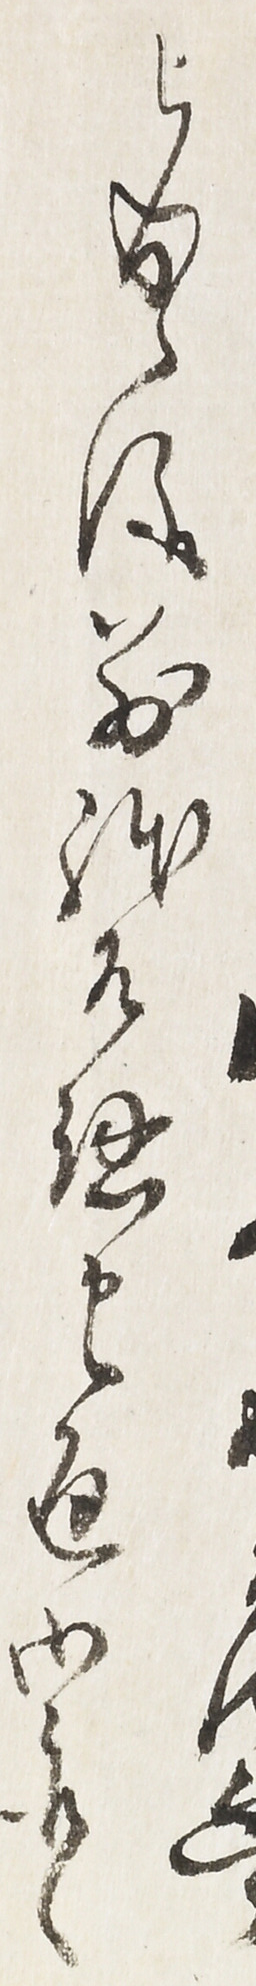被成候趣別紙相認申候通御座候
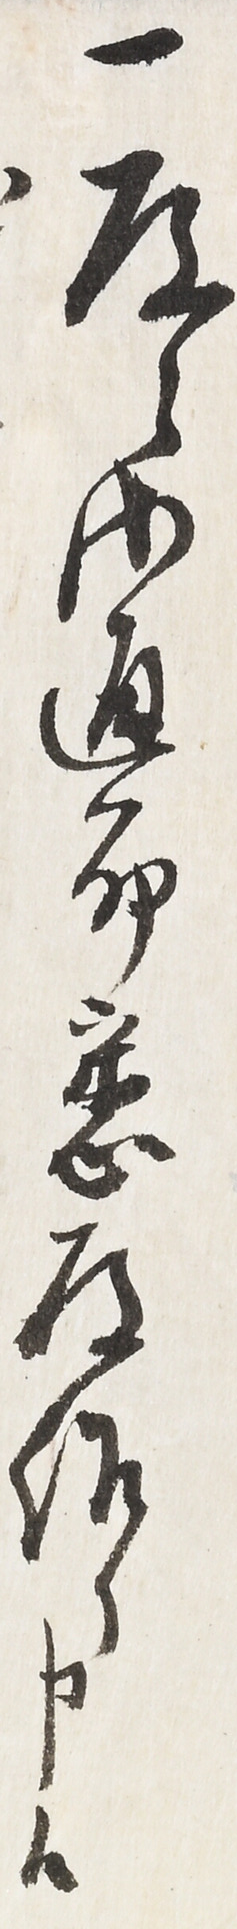一道々御通筋悉道作り申候
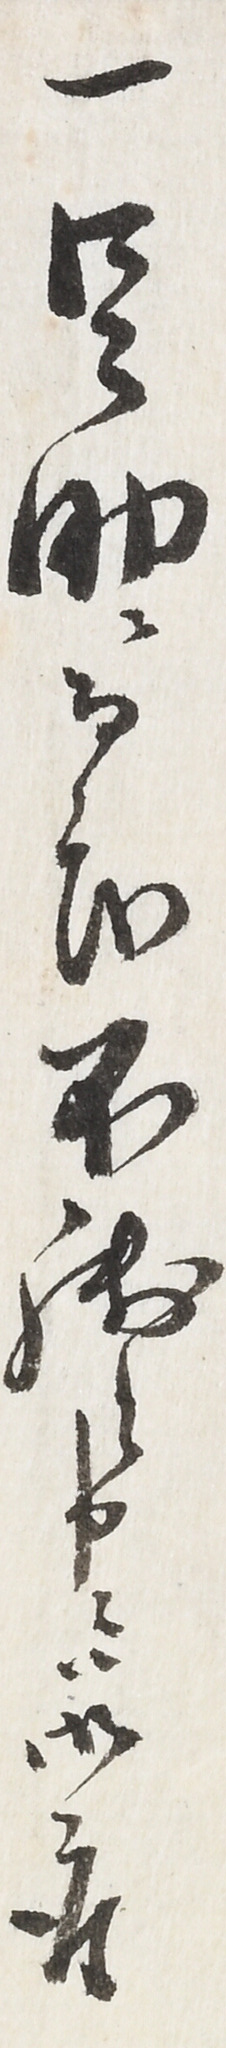一足助ニ而も不残と申ニハ御座
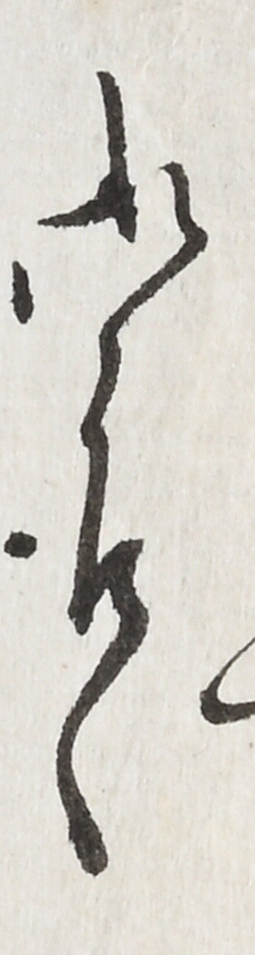御座候
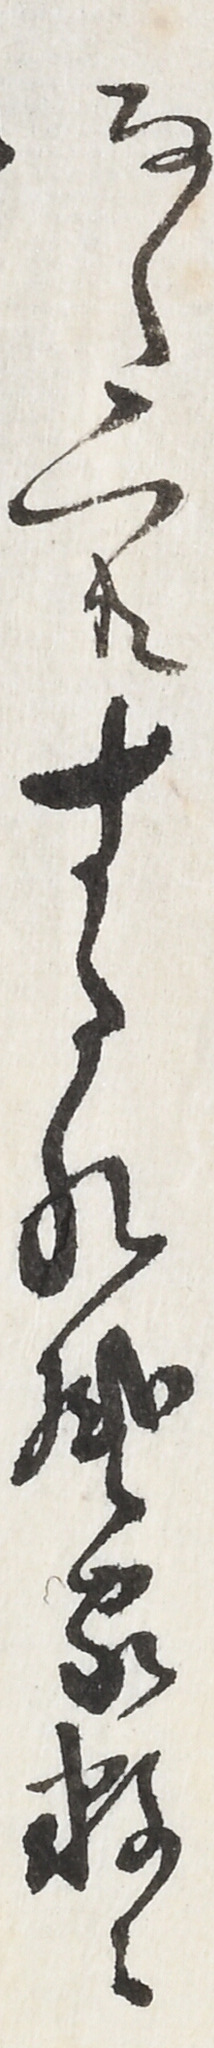なく候へ共すたれ掛候家数々
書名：御測量方御出ニ付三州迄罷出御窺聞合覚書
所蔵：伊那市立高遠町図書館・合同会社AMANE
